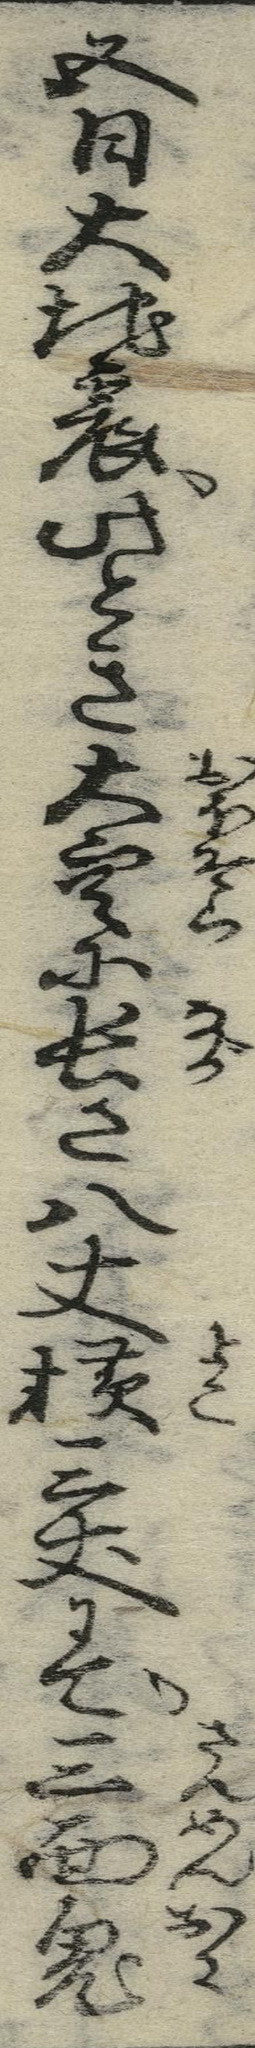五日大地震。此とき大空に長さ八丈横三丈にて。三面鬼
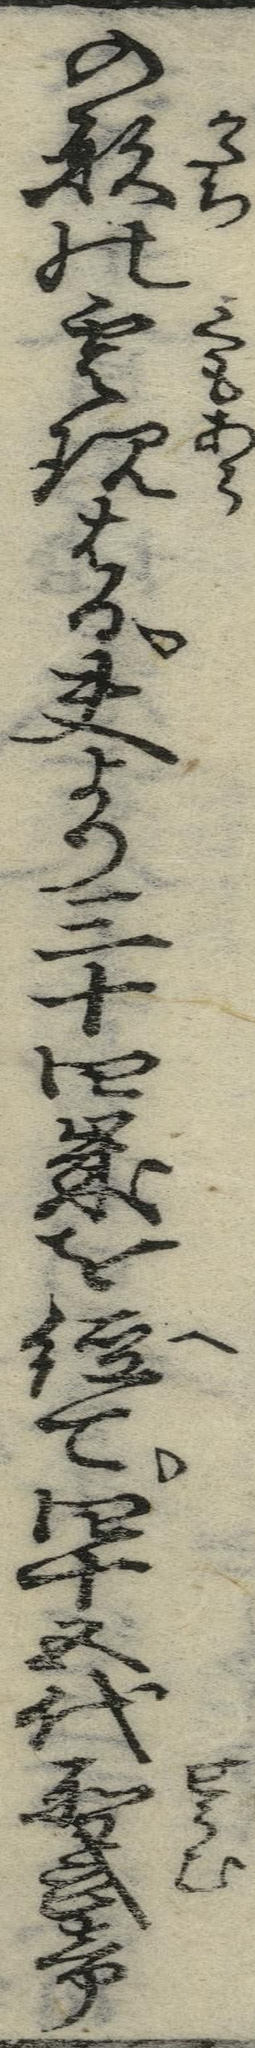の形の雲現はる。夫より三十四歳を経て。四十五代聖武帝
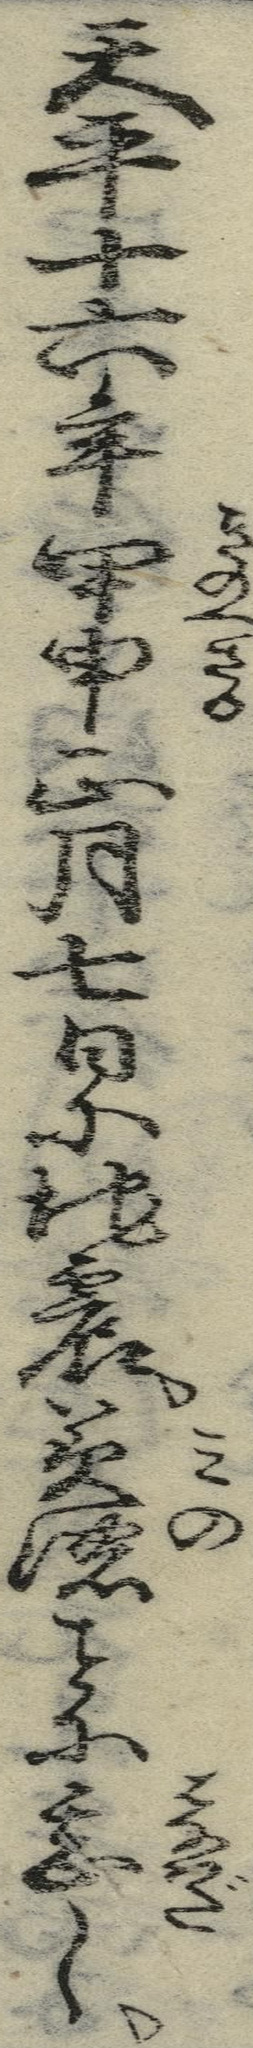天平十六年甲申正月七日に地震。美濃ことに甚し。
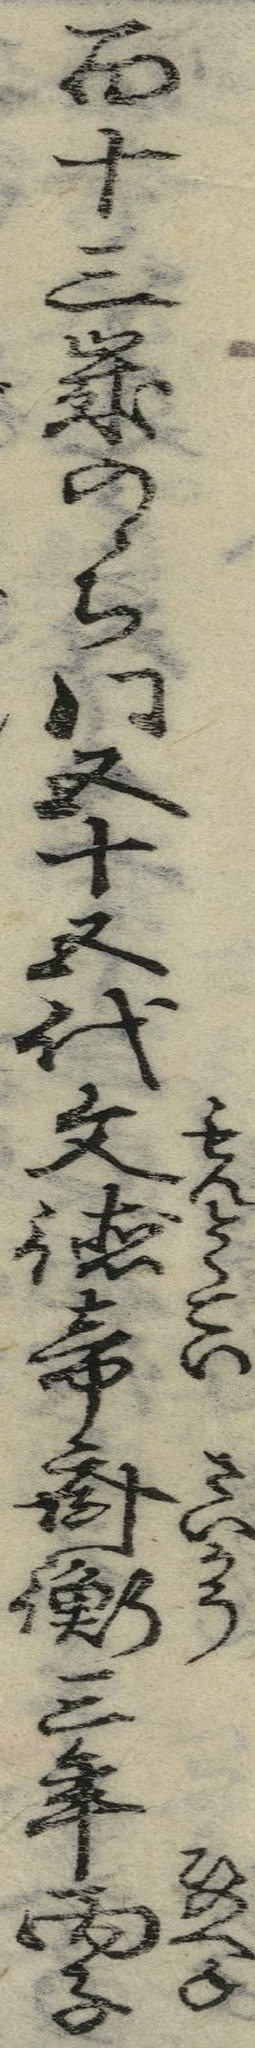百十三歳のゝち同五十五代文徳帝斉衡三年丙子
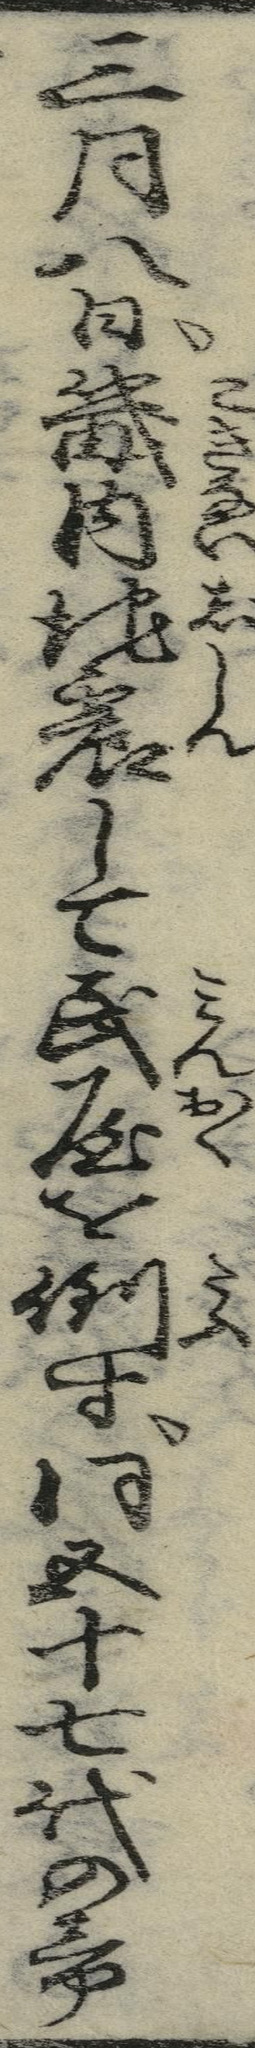三月八日。畿内地震して民屋を倒す。同五十七代の帝
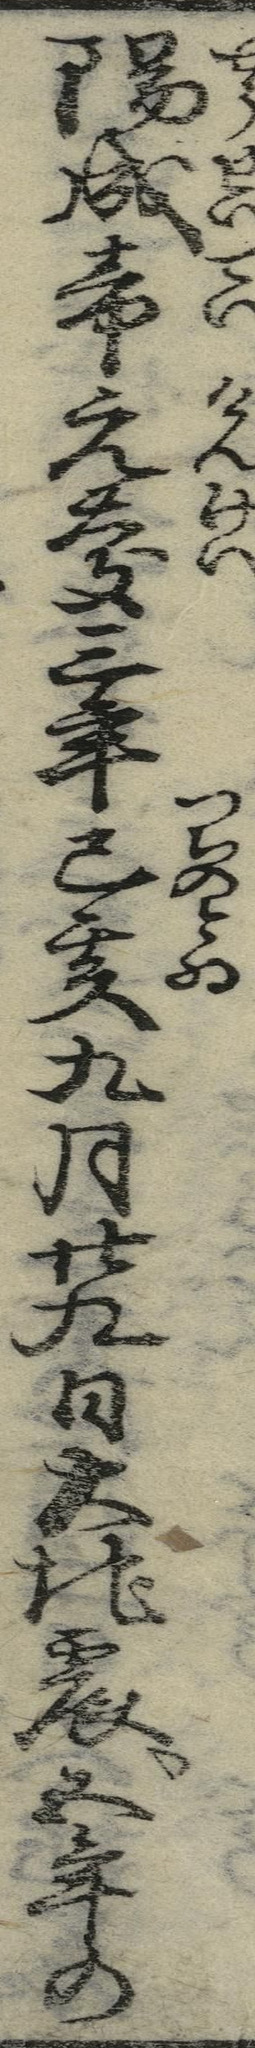陽成帝元慶三年己亥九月廿九日大地震。五年の
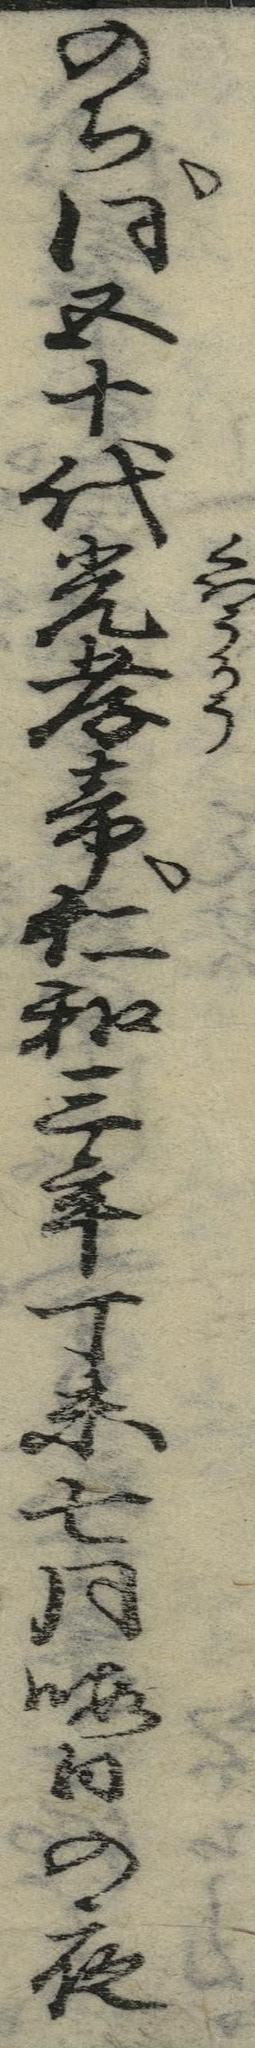のち。同五十代光孝帝。仁和三年丁未七月晦日の夜

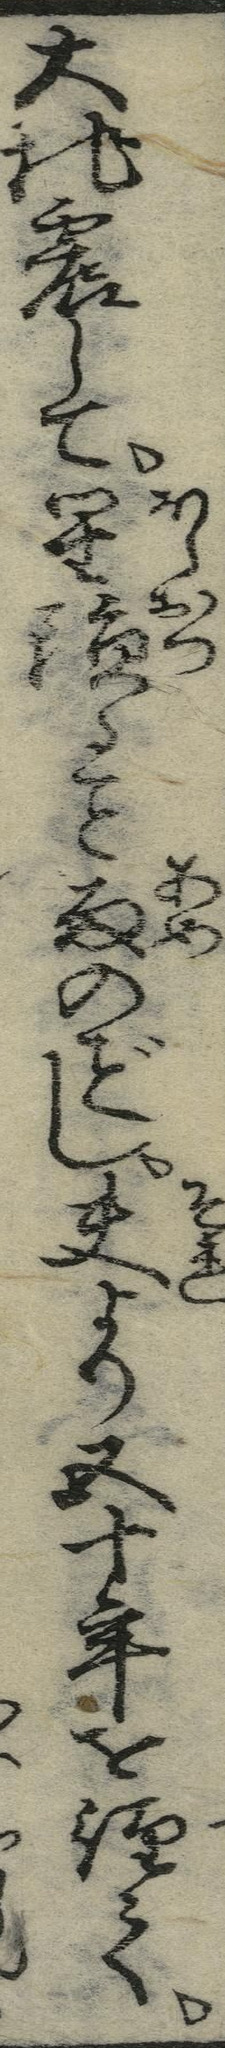大地震して、星隕ること雨のごとし。夫より五十年を経て。
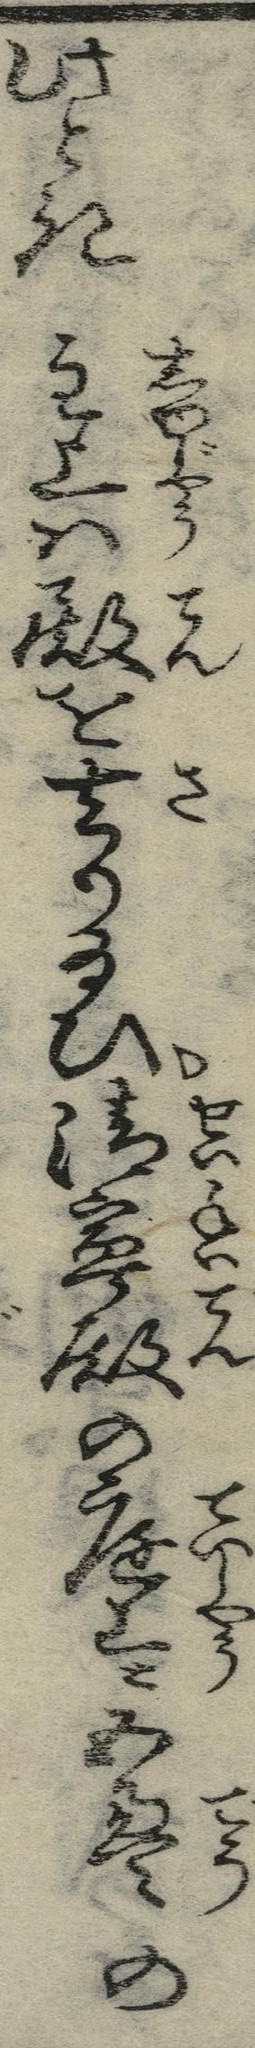此とき主上は殿を去り給ひ。清寧殿の庭上に五畳の
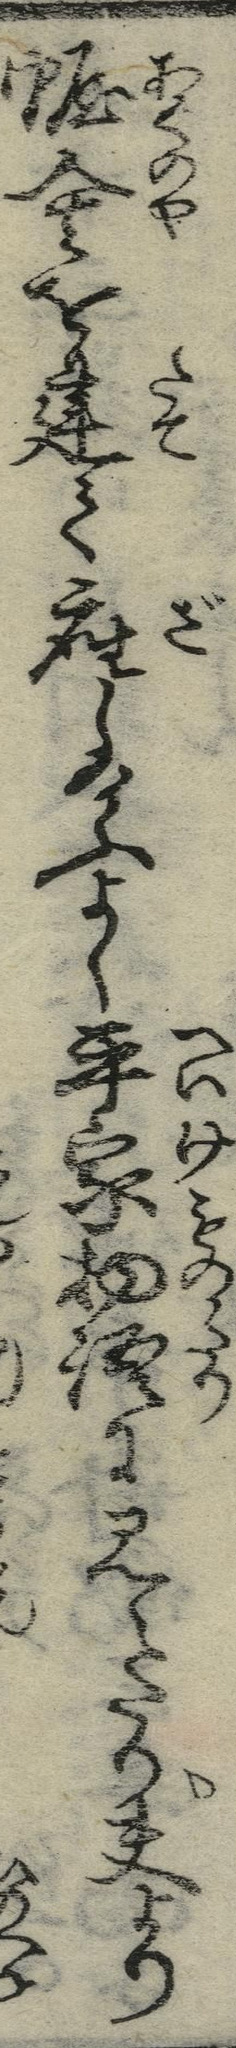幄舎を建て座し給ふよし平家物語に見えたり。夫より
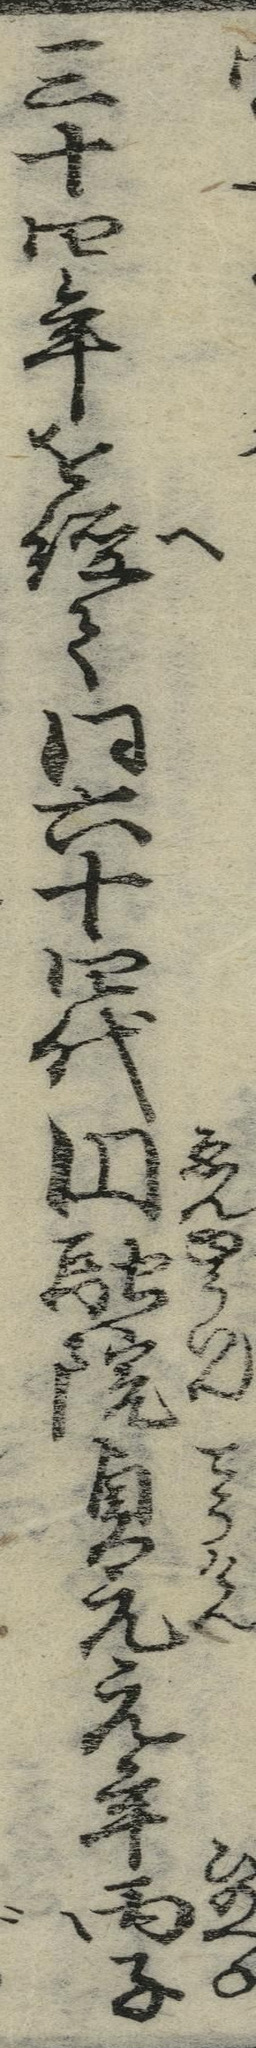三十四年を経て同六十四代円融院貞元元年丙子
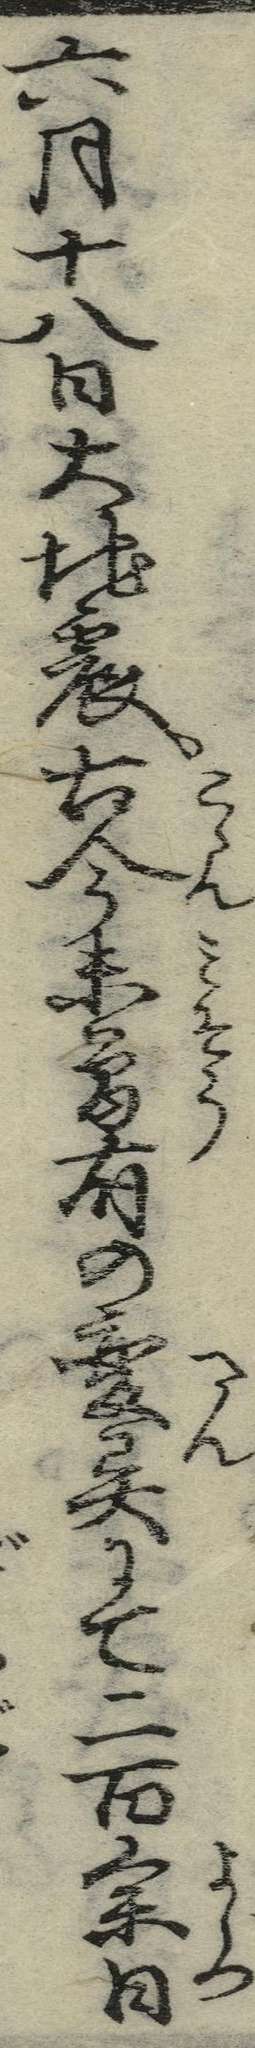六月十八日大地震。古今未曾有の変異にて二百余日
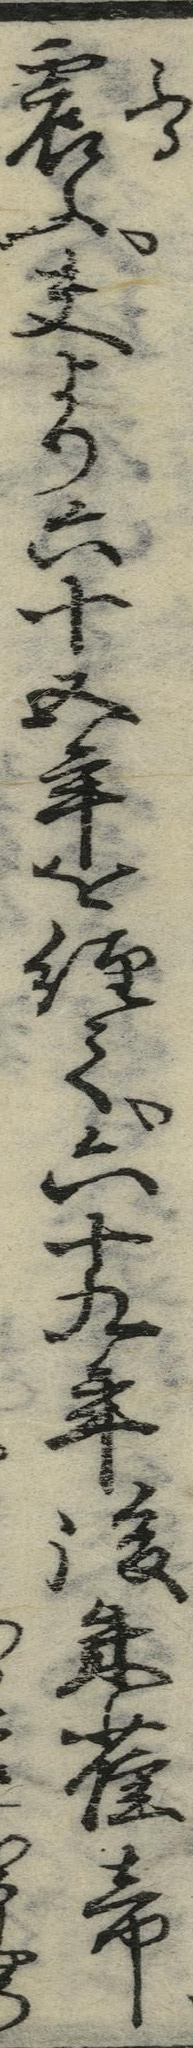震ふ。夫より六十五年を経て、六十九年後朱雀帝。
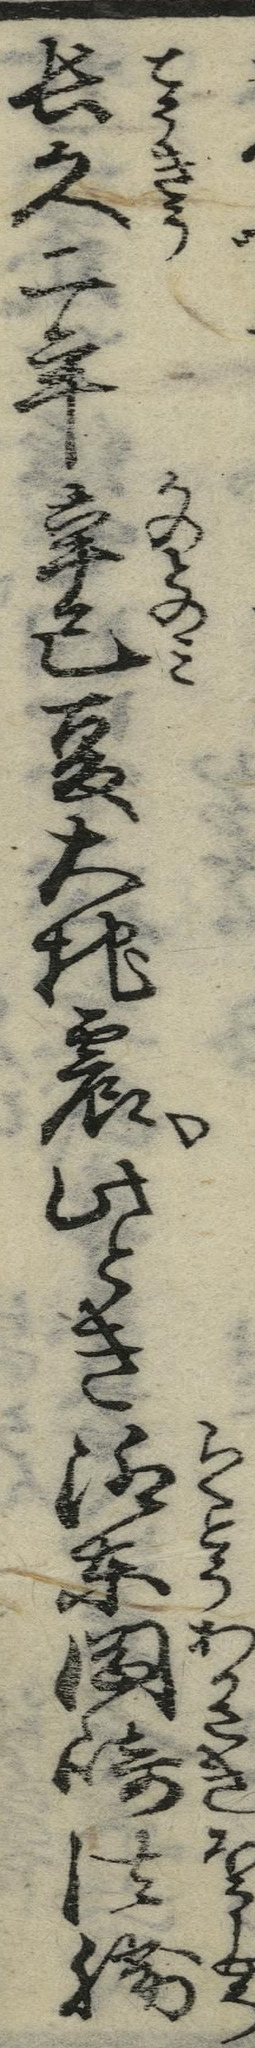長久二年辛巳夏大地震。此とき洛東岡崎法勝
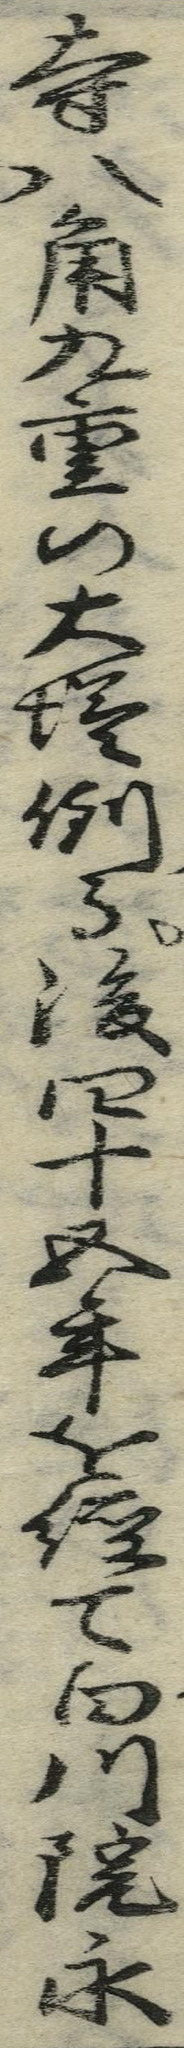寺八角九重の大塔倒る。後四十五年を経て白川院永
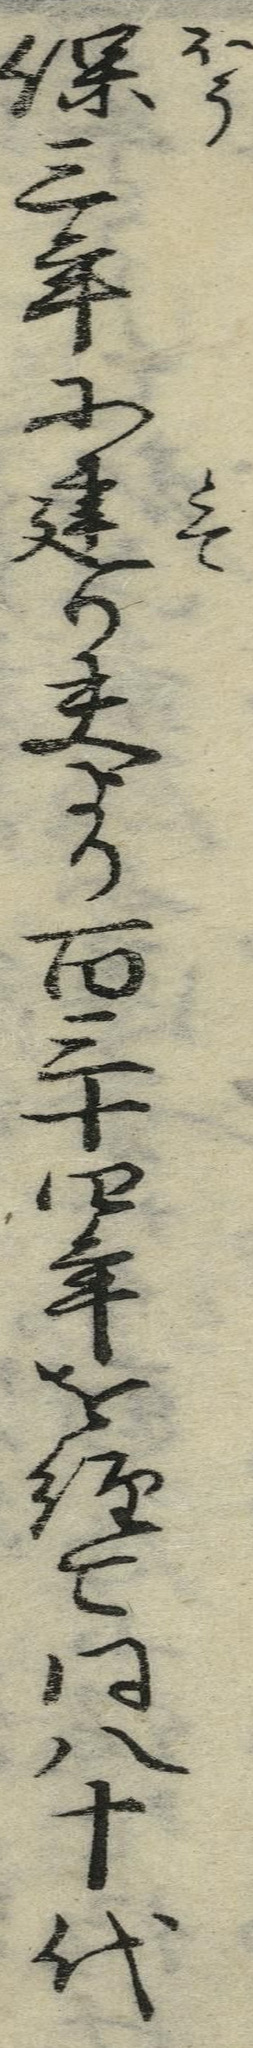保三年に建り夫より百三十四年を経て同八十代
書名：本朝地震記　全
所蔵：東京大学地震研究所図書室 Earthquake Research Institute Library, The University of Tokyo, JAPAN
